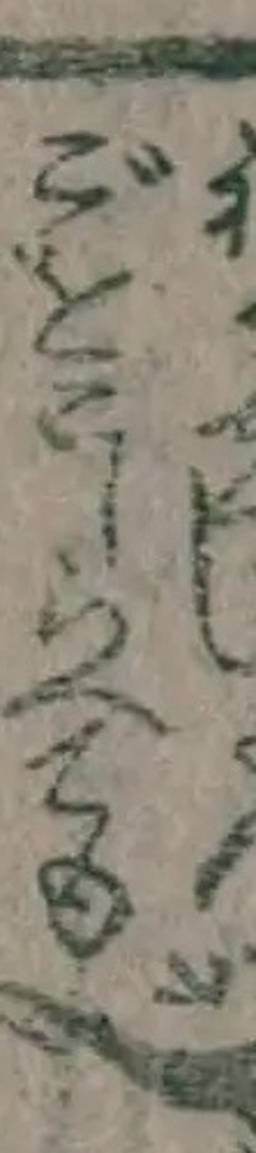ごをこしらへても
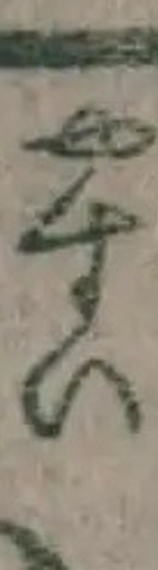やすい
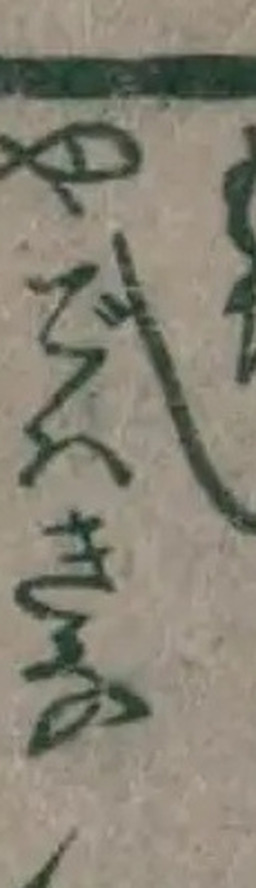やではきな
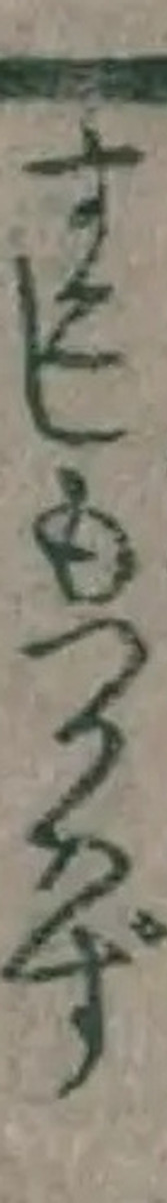すこしもつかはず
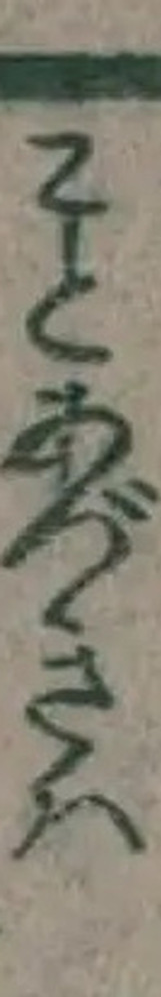ことあづきは
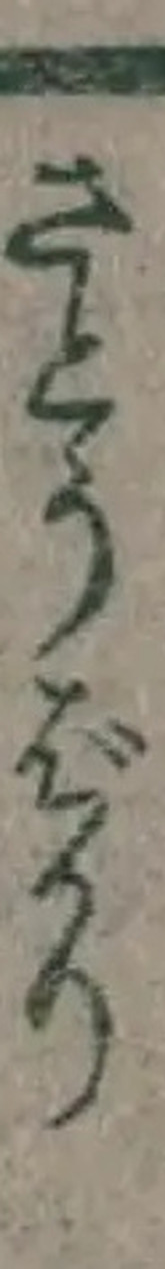さとうばかり
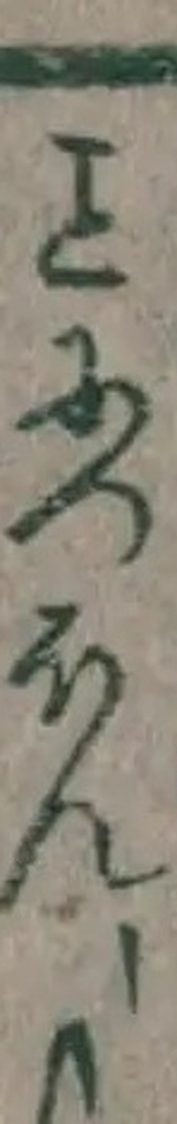ことにつほん
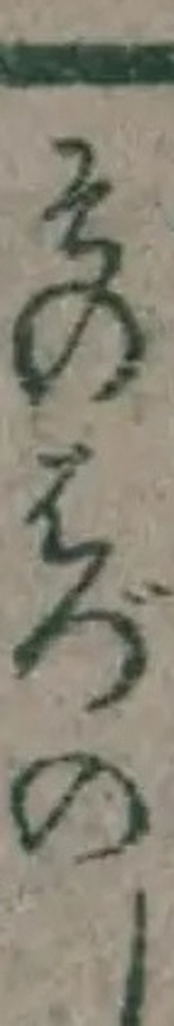そのはづの
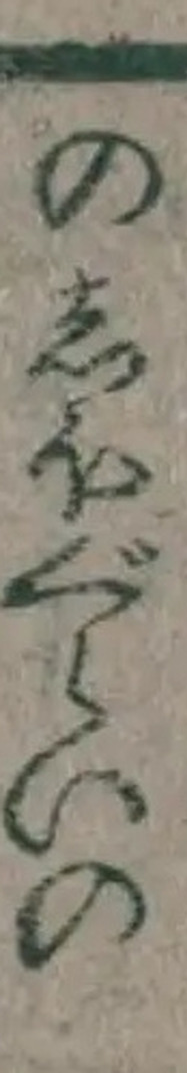のしほぐらいの
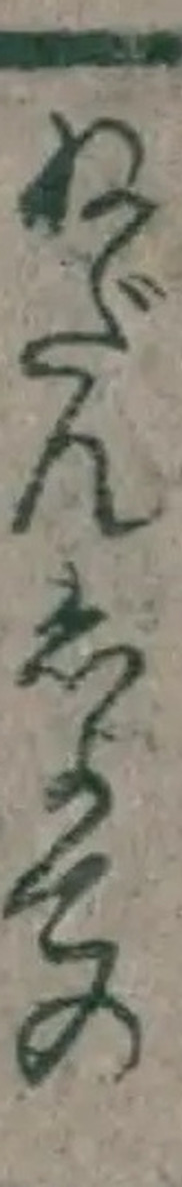ねだんしよての

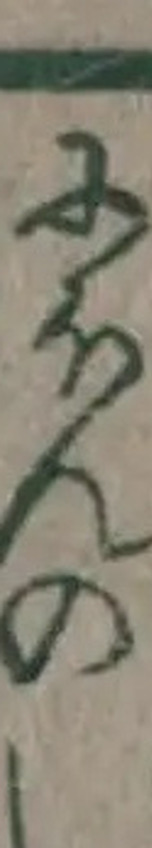にほんの
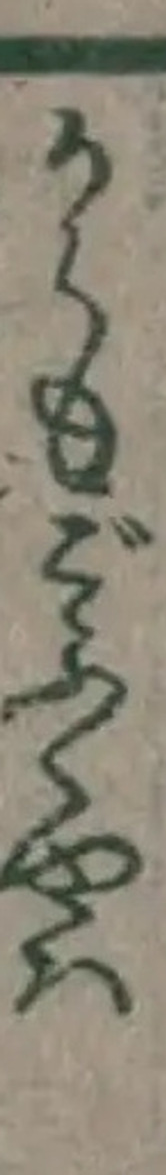からもごふくやは
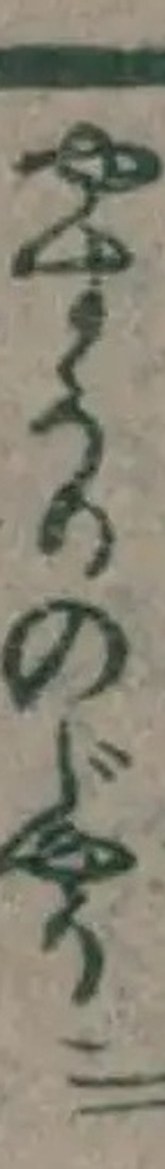やすうりのじやう
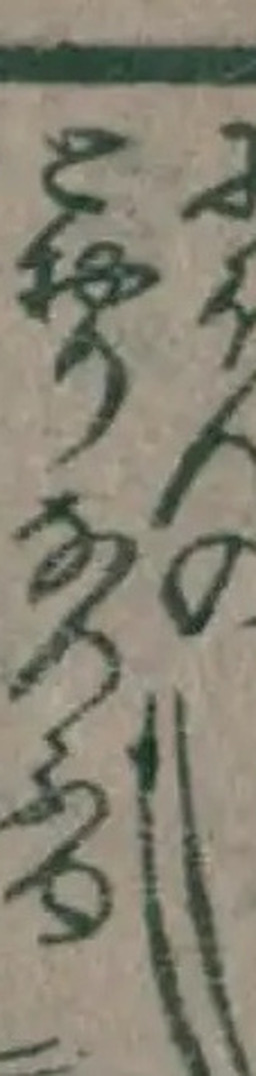とおりなつふゆ
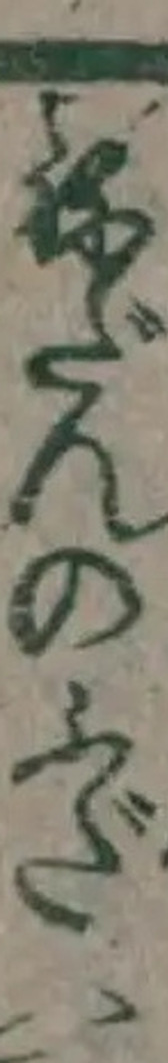ねだんのふだ
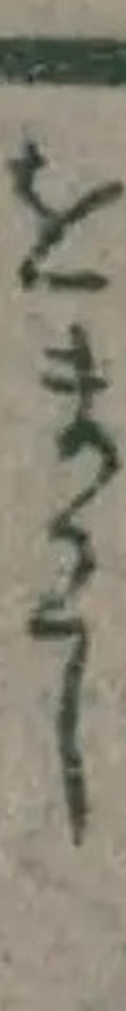をまわし
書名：縦筒放唐の噺 3巻
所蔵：国立国会図書館 National Diet Library, JAPAN
